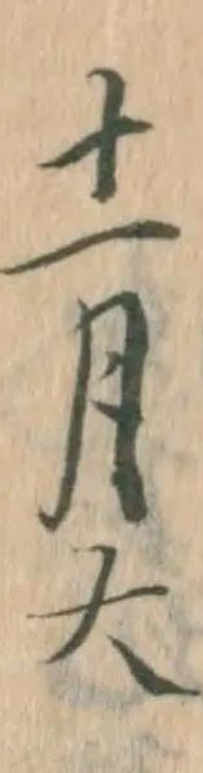十一月大
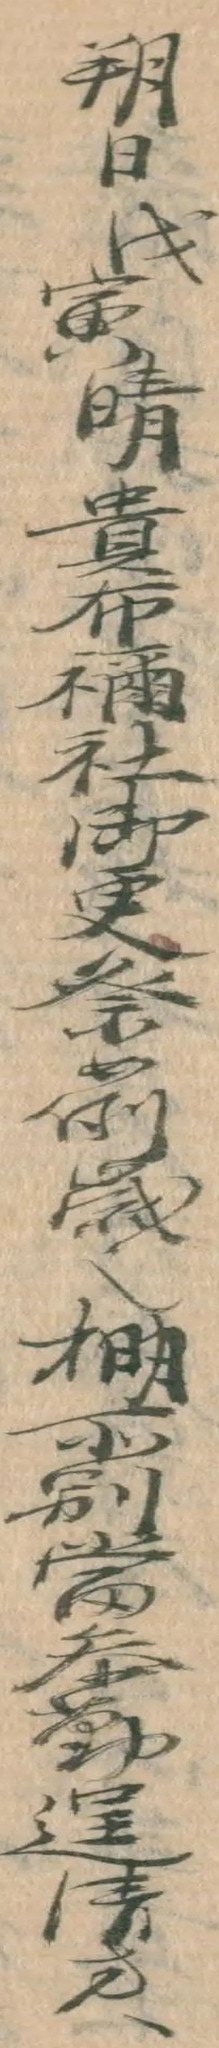朔日戊寅晴貴布禰社御更祭如例歳之棚所別當奉勤逞清方へ
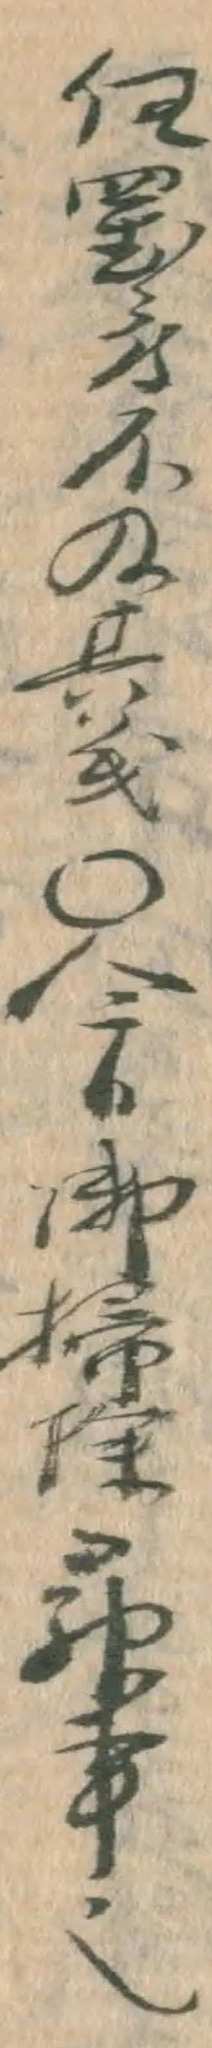任置ニ付不及其義○今日御掃除御神事也
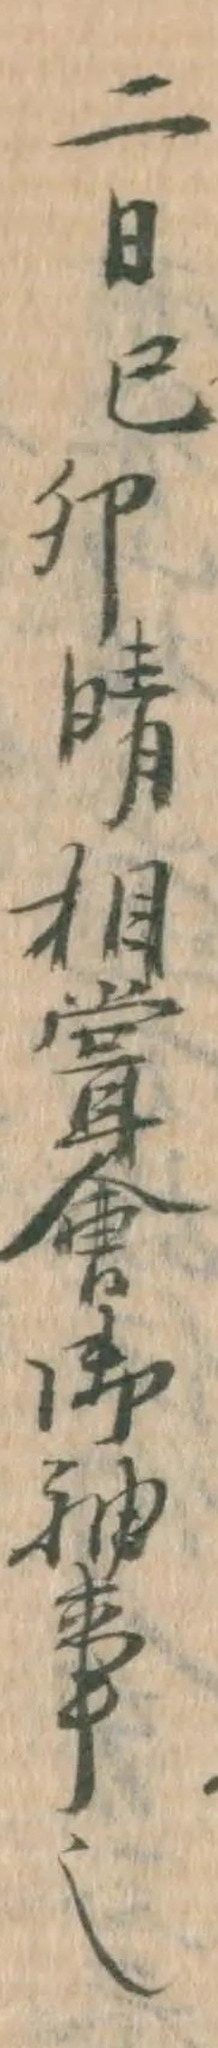二日己卯晴相嘗會御神事也
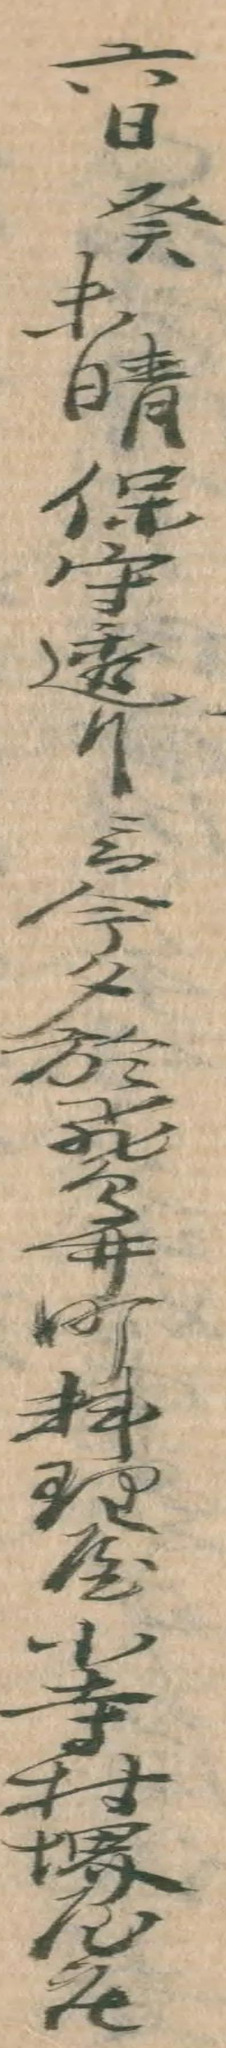六日癸未晴保守遠引ニ而今夕於飛鳥井町料理屋小寺村堺屋庄
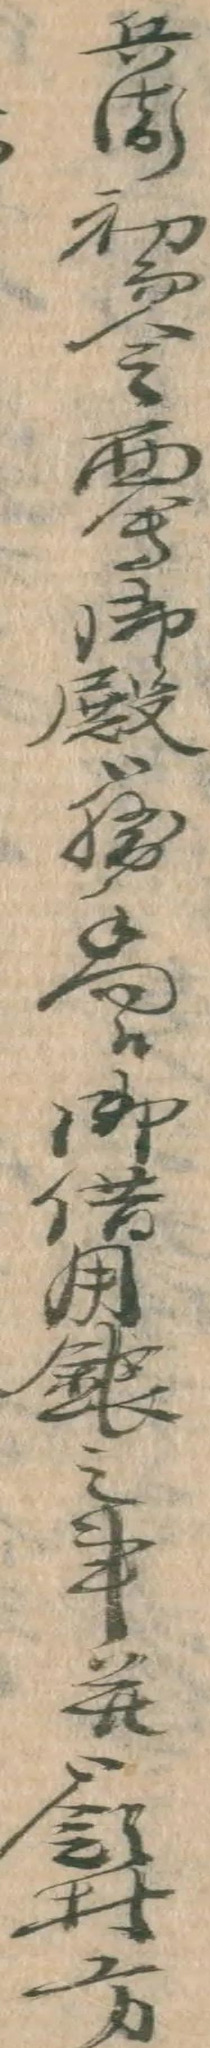兵衛初而令西會御殿御勝手向江御借用銀之事并御領村方
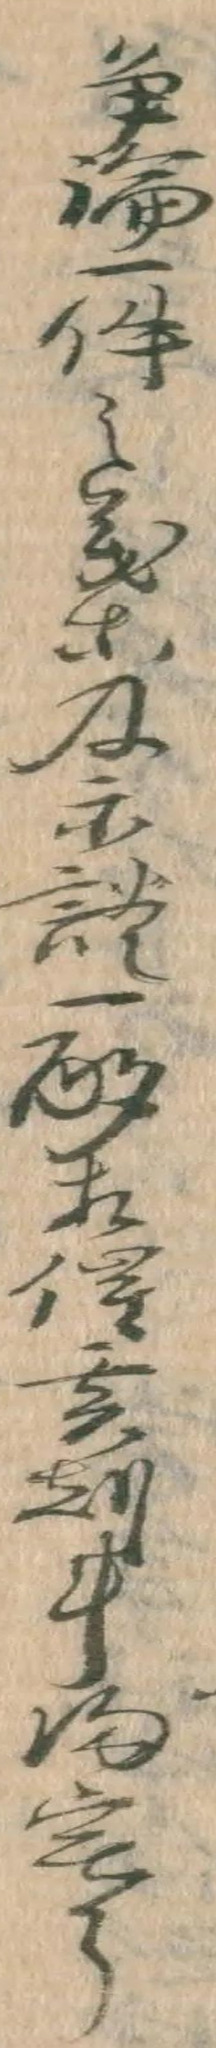争論一件之義等及示談一酌相催亥刻斗帰宅了
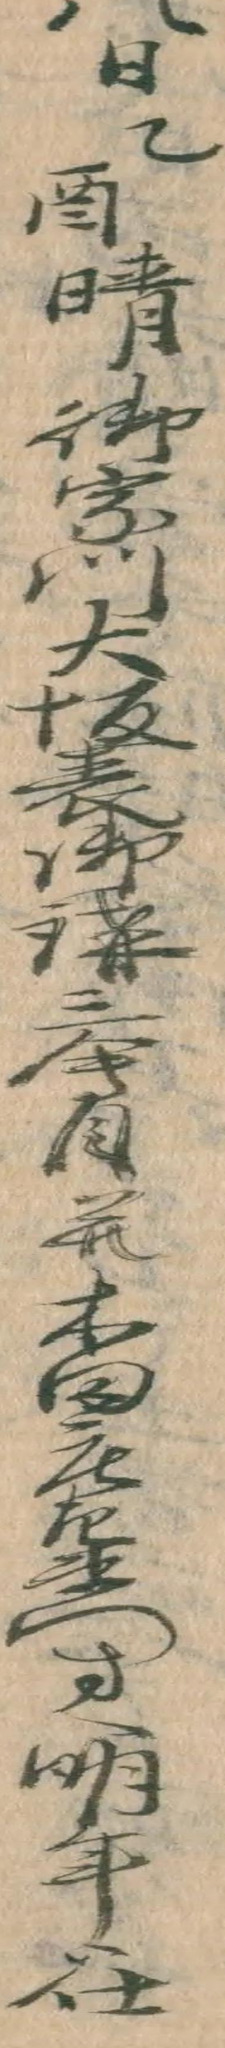八日乙酉晴御家門大坂表御請三會目并木田庄左衛門方へ明年御仕
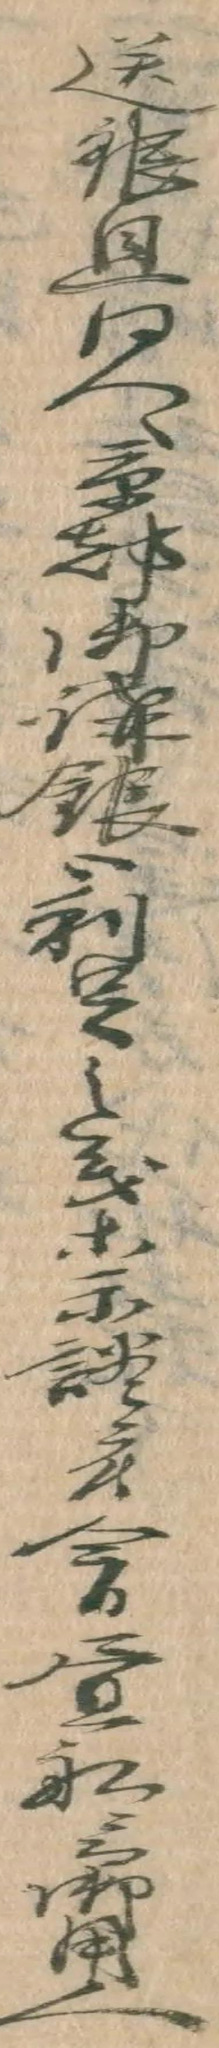送銀且同人へ京都御講銀御利足之義等示談ニ付今日昼舩ニ而御用人
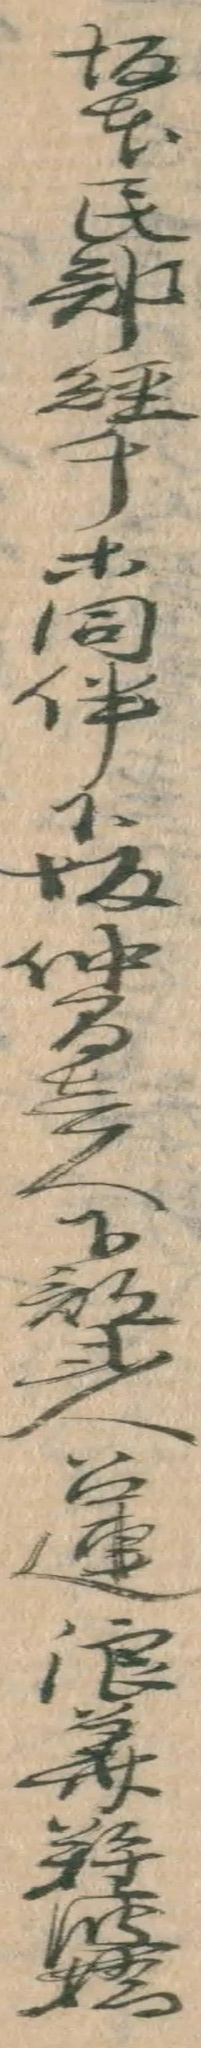坂本民部経千等同伴下坂仲間壱人下部弐人召連浪斎難波橋
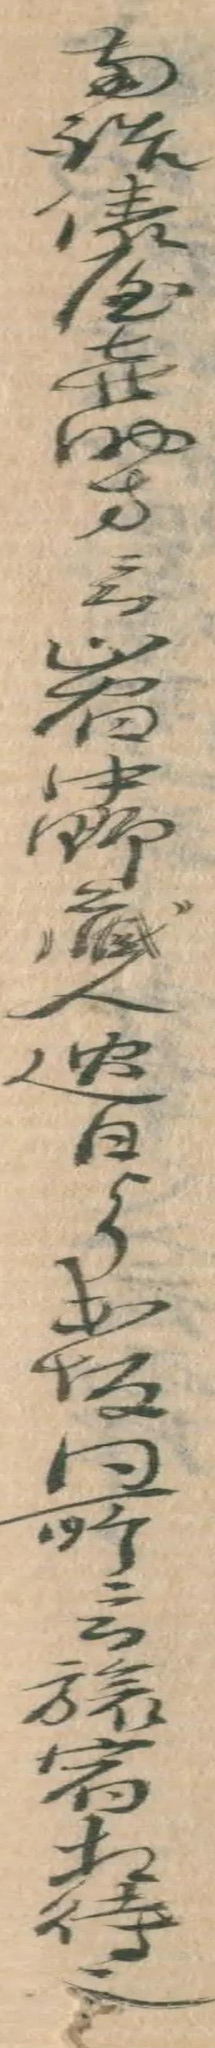両詰俵屋喜助方ニ而正宿中野蔵人過日より出坂同所ニ而旅宿相待也
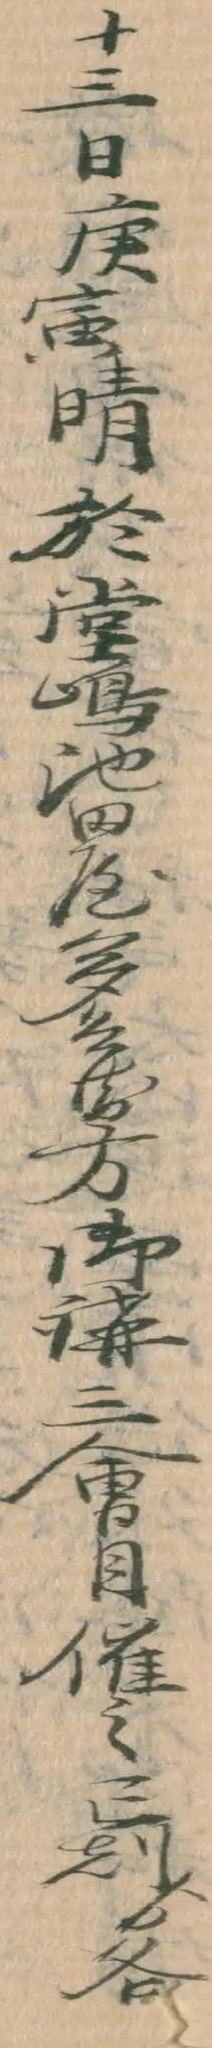十三日庚寅晴於堂嶋池田屋多兵衛方御講三會目催之巳刻ゟ各
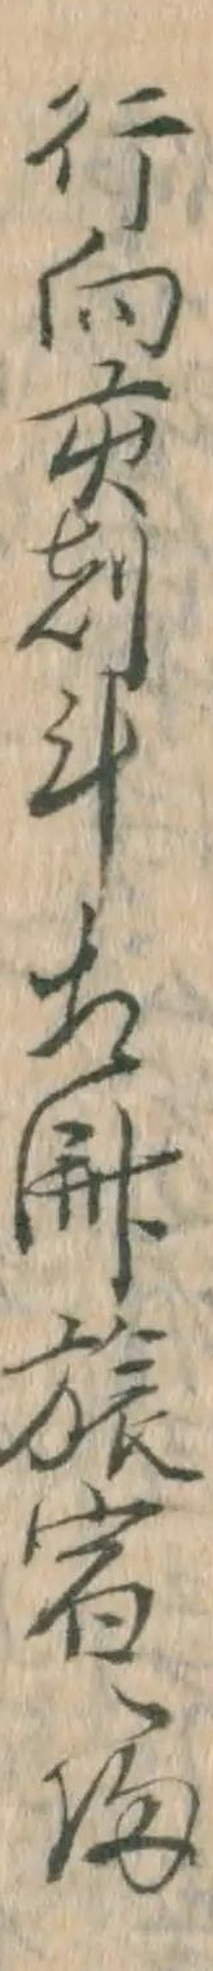行向亥刻斗相済旅宿へ帰
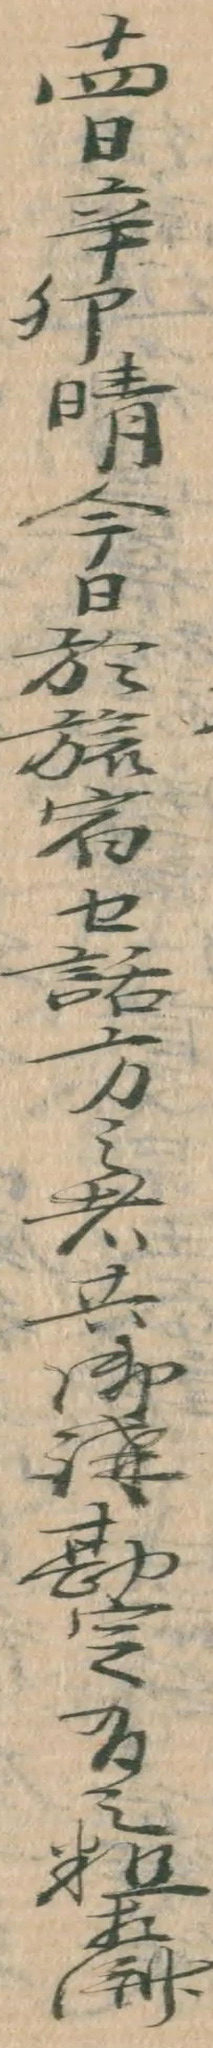十四日辛卯晴今日於旅宿せ話方之者共御講勘定有之粗相済
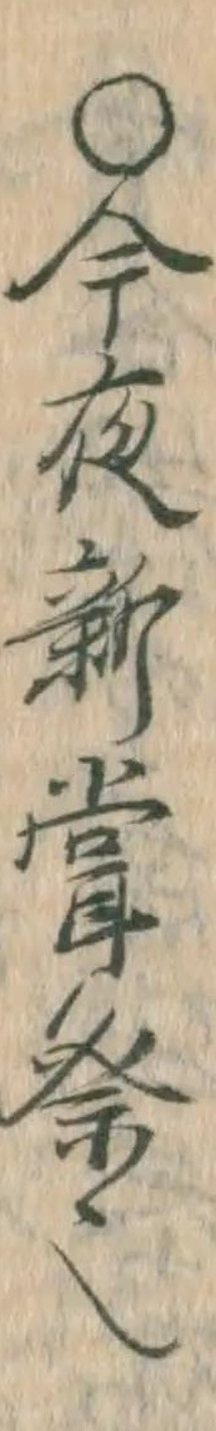○今夜新嘗祭也
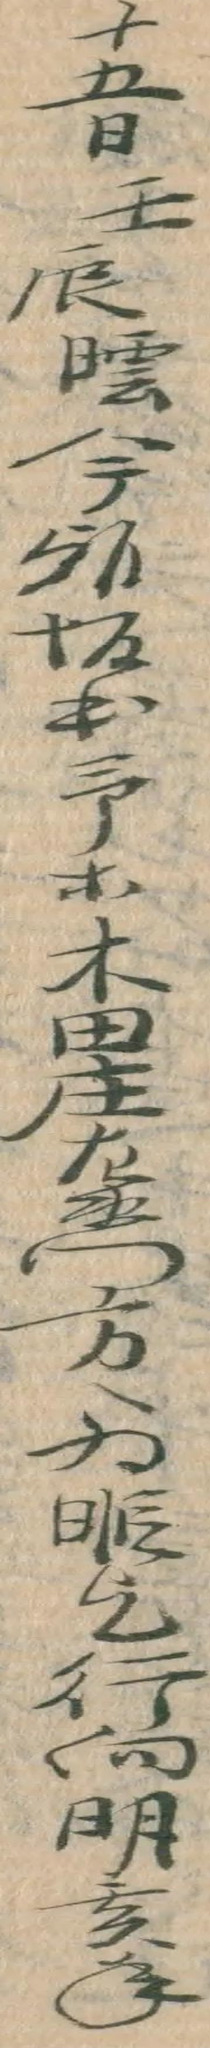十五日壬辰曇今朝坂本予等木田庄左衛門方へ為暇乞行向明亥年
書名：賀茂社記録. 第65冊
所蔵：国立国会図書館 National Diet Library, JAPAN
